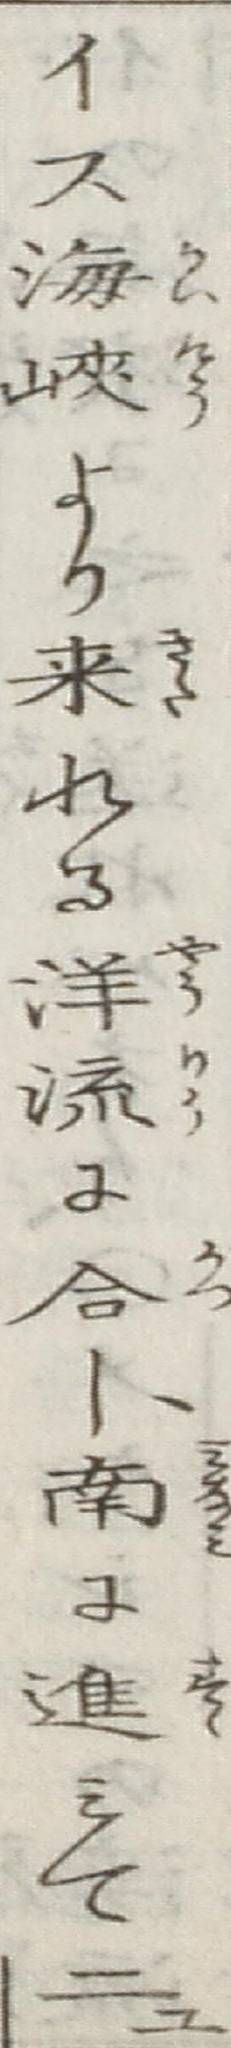リス海峡より来れる洋流に合し、南に進みてニュ
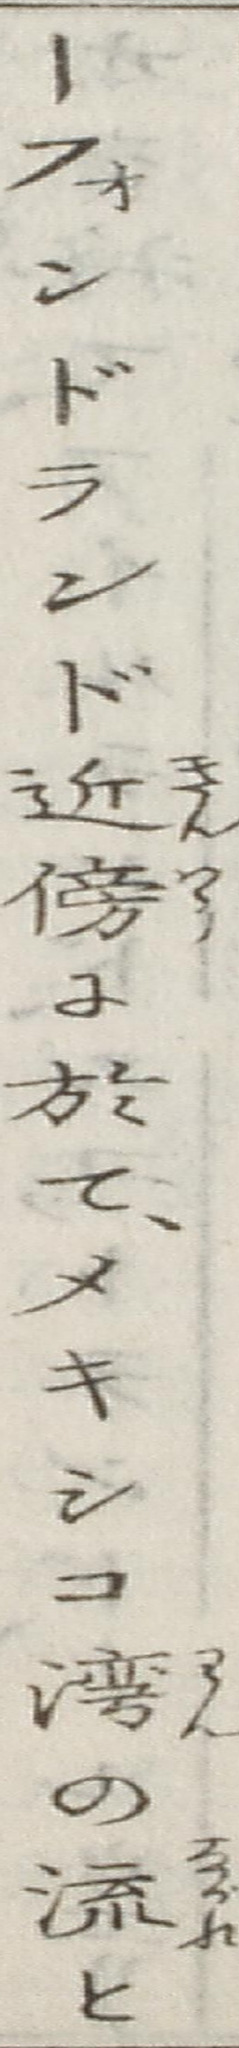ーフォンドランド近傍に於て、メキシコ湾の流と
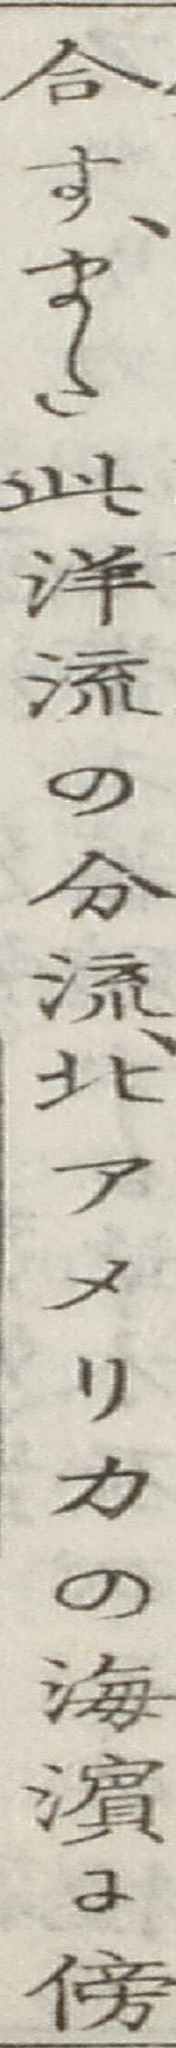合す、また此洋流の分流北アメリカの海浜に傍
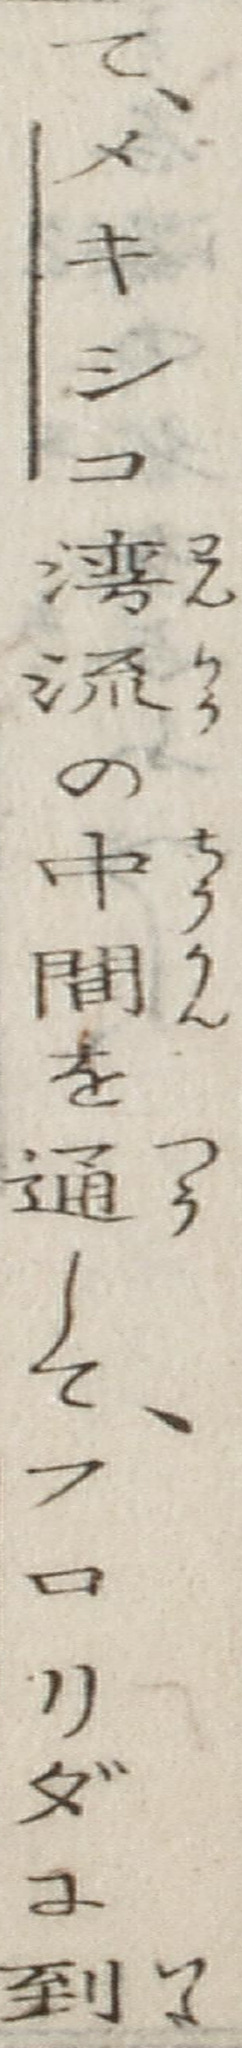て、メキシコ湾流の中間を通して、フロリダに到
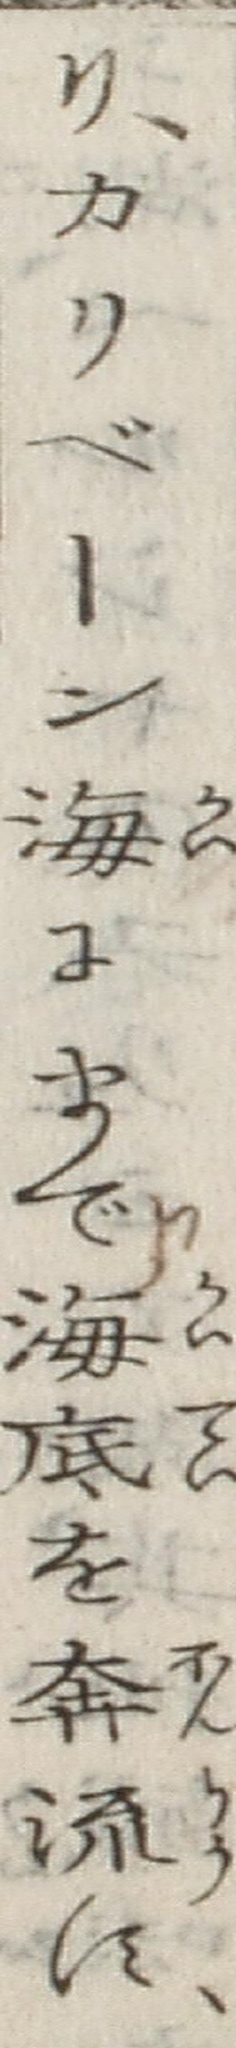り、カリベーン海にまで海底を奔流す、
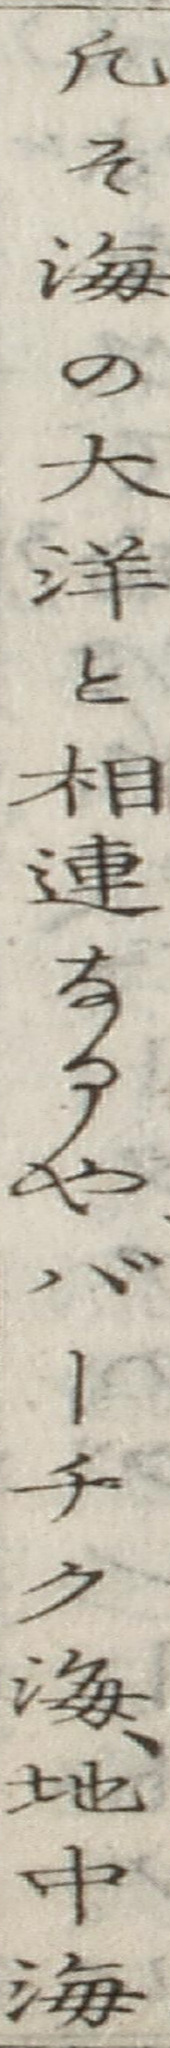凡そ海の大洋と相連なるや、バーチク海地中海
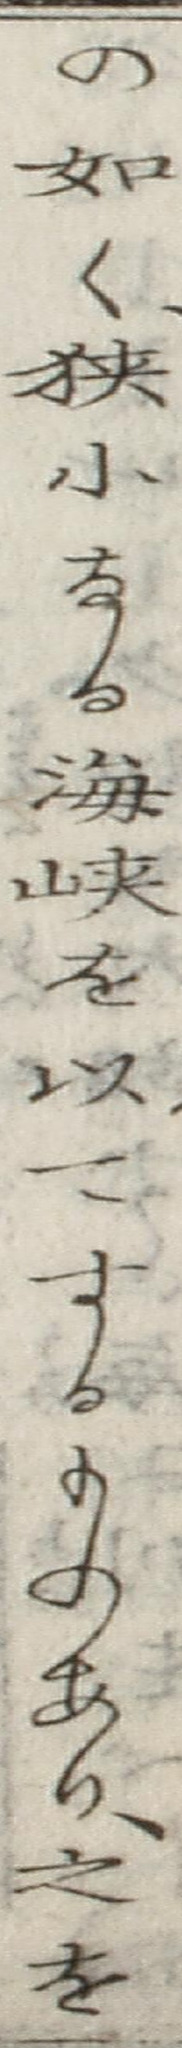の如く、狭小なる海峡を以てするものあり、之を
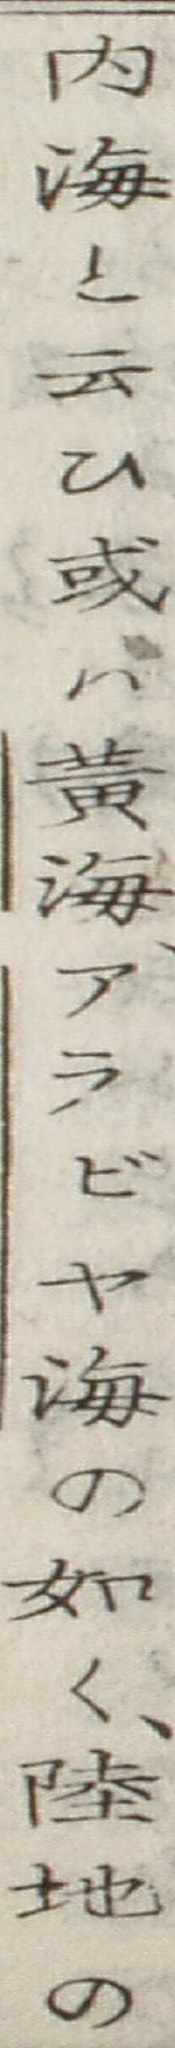内海と云ひ、或は黄海、アラビヤ海の如く、陸地の
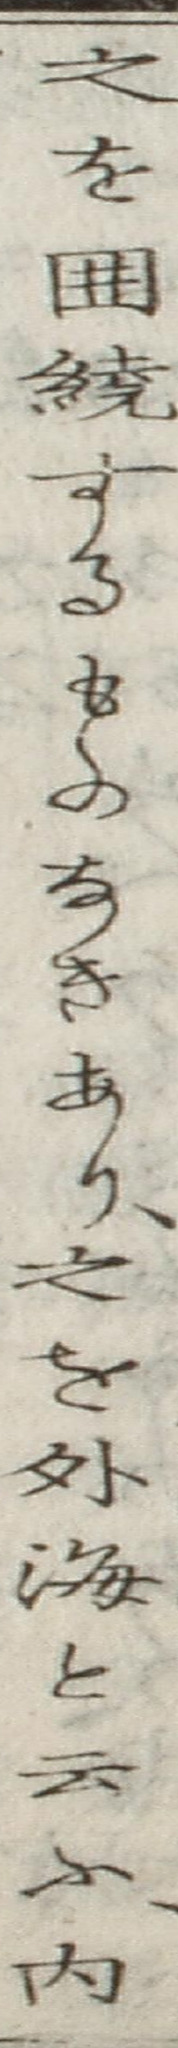之を囲繞するものなきあり、之を外海と云ふ、内
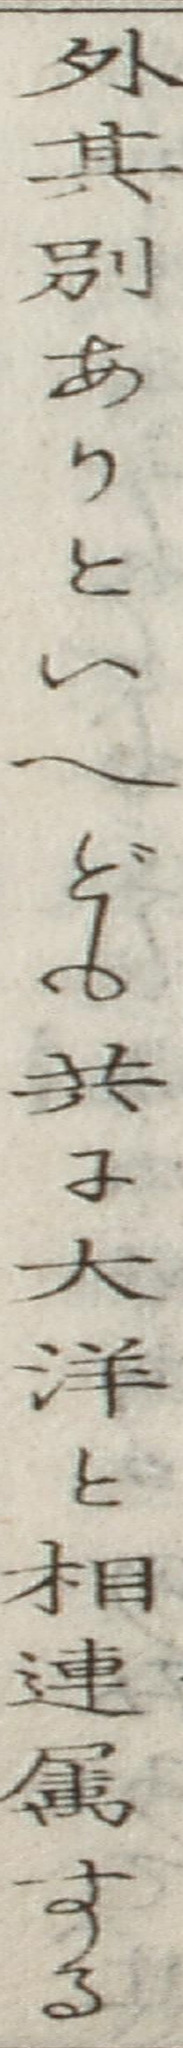外其別ありといへども、共に大洋と相連属する
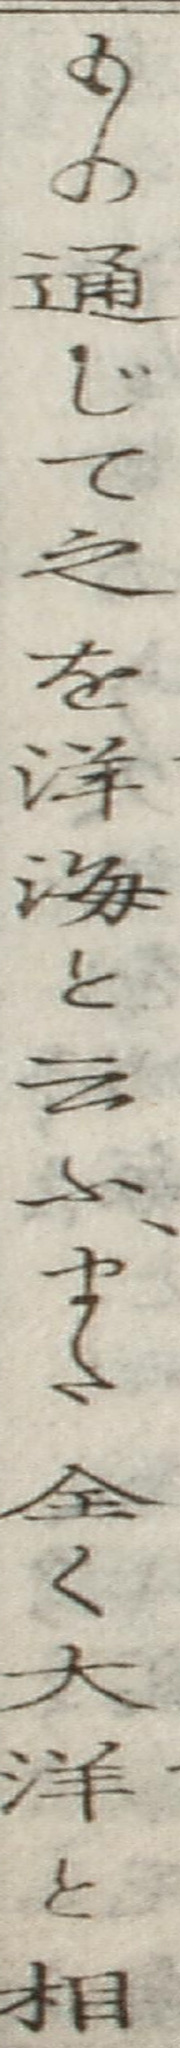もの、通じて之を洋海と云ふ、また全く大洋と相

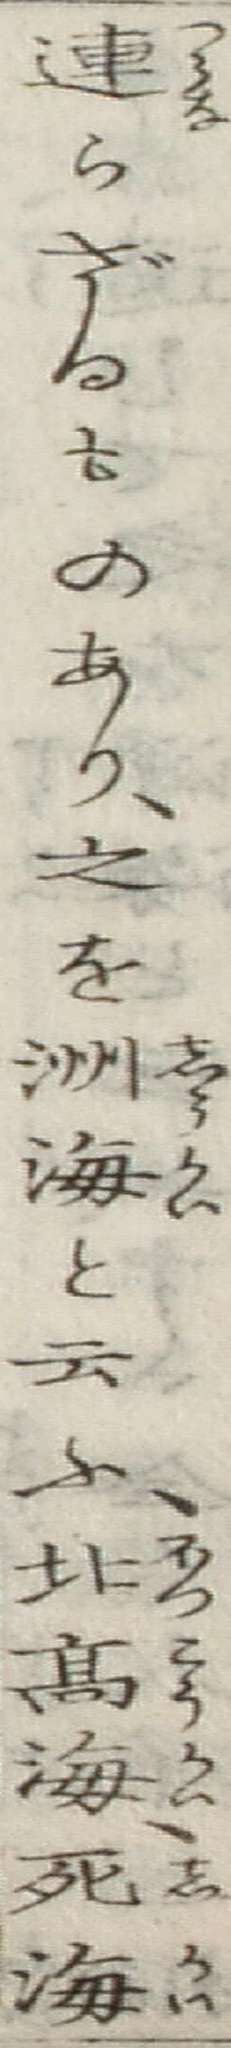連らざるものあり、之を洲海と云ふ、北高海、死海
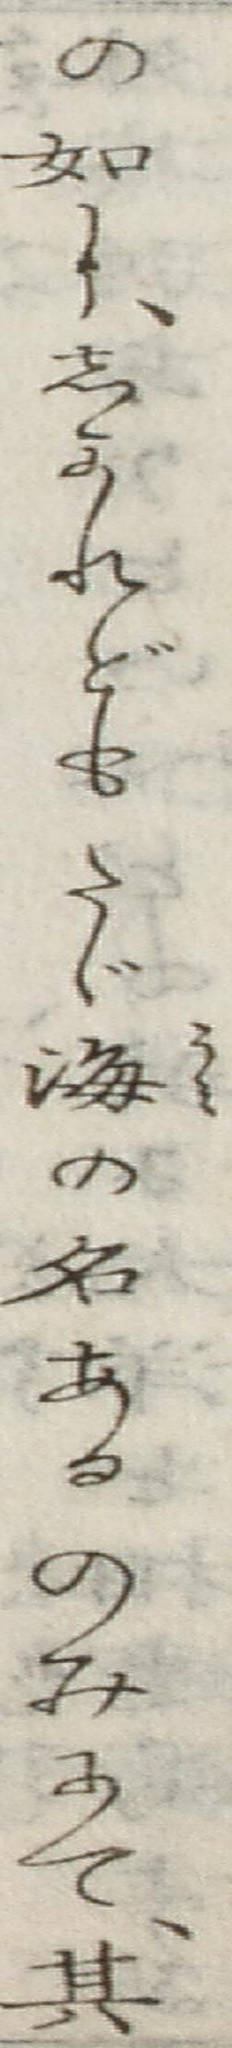の如し、しかれどもたゞ海の名あるのみにて、其
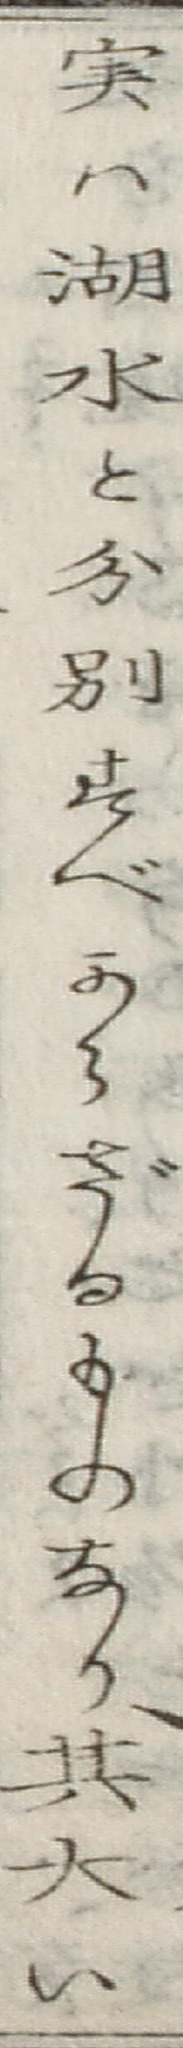実は湖水と分別すべからざるものなり、其大い
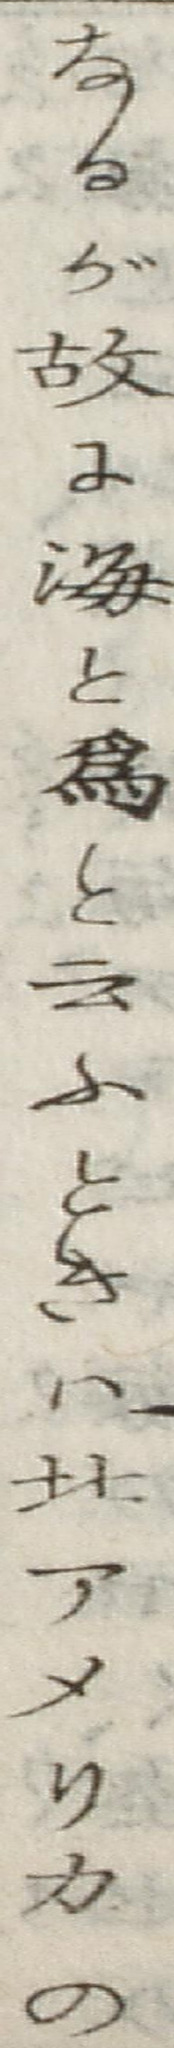なるが故に海と為と云ふときは、北アメリカの
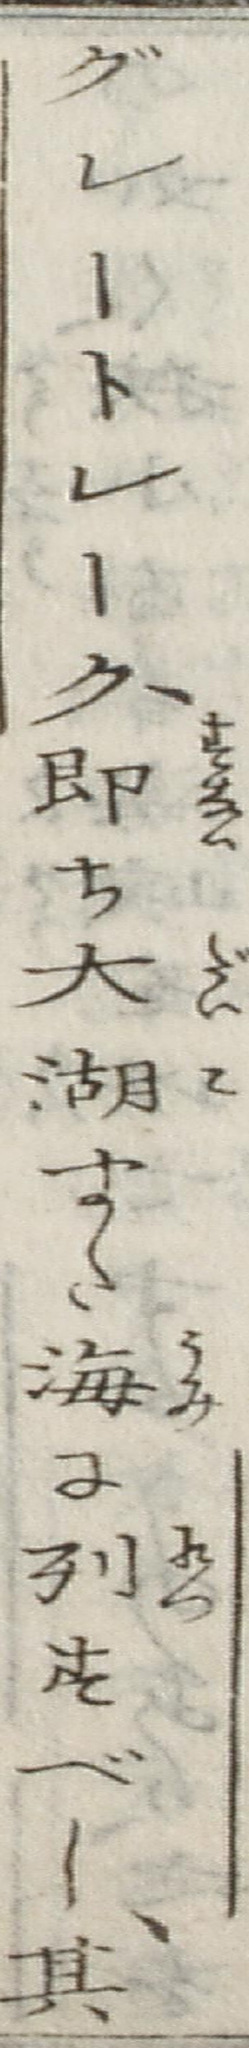グレートレーク、即ち大湖また海に列すべし、其
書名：訓蒙　天然地理學　中
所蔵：東京大学地震研究所図書室 Earthquake Research Institute Library, The University of Tokyo, JAPAN
